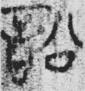訟
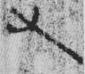又（有）
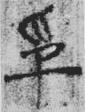孚
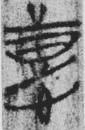懥（窒）
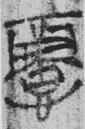○（惕）
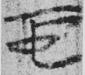𠁩
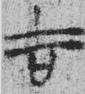吉
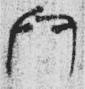夂（終）
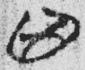凶
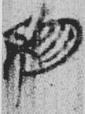利
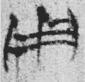用
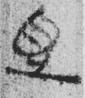見
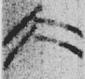大
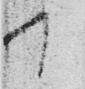人
